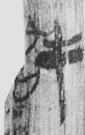○（凡）
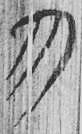勿（物）
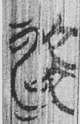流
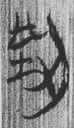型（形）
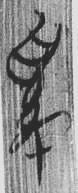○（奚）
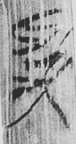○（得）
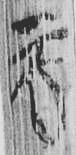而
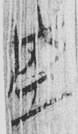城（成）
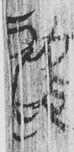流
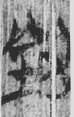型（形）
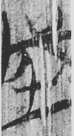城（成）
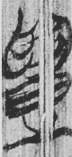豊（體）
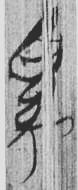○（奚）
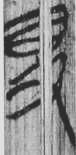○（得）
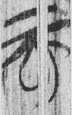而
